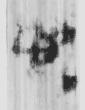心
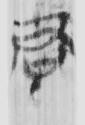君
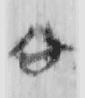公
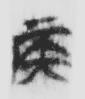侯
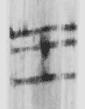王
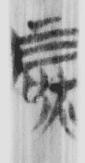庶
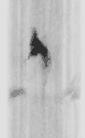人
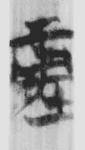坪
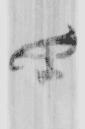民
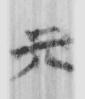亓
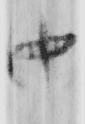母
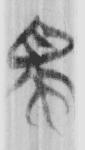蜀
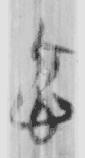忻
